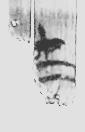十二
